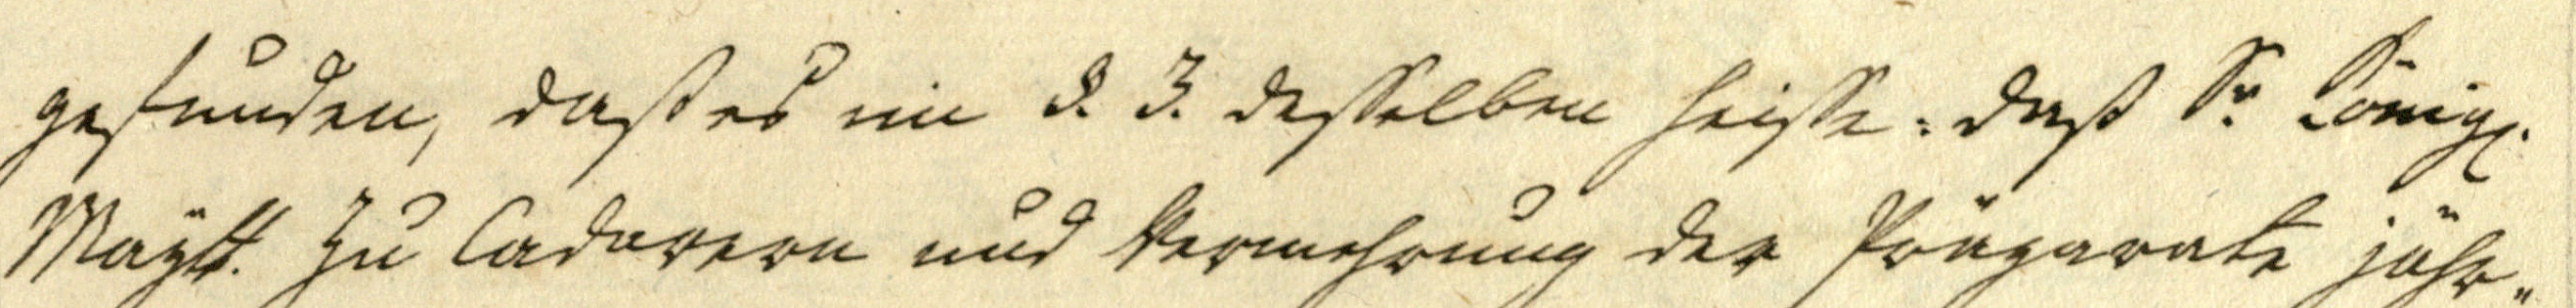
gefunden, daß es im § 3. desselben heisse: daß Sr. Königl.
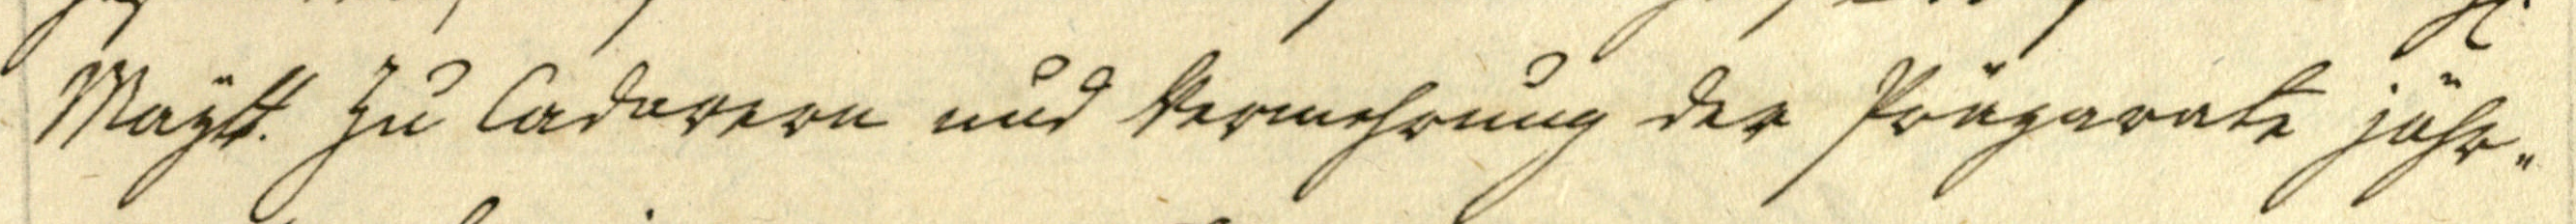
Maÿtt. zu Cadavern und Vermehrung der Präparate jähr¬
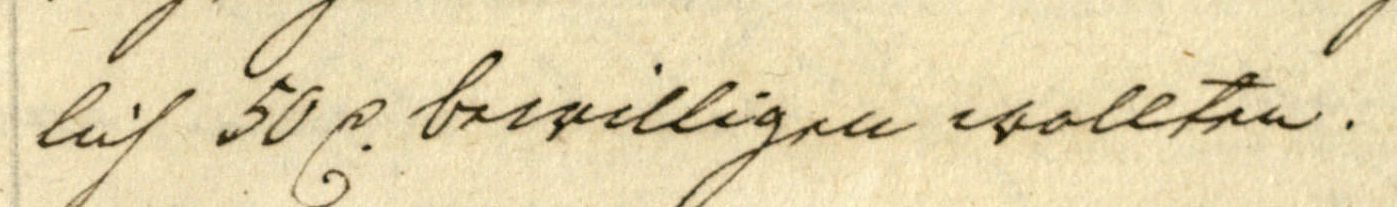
lich 50 l. bewilligen wollten.
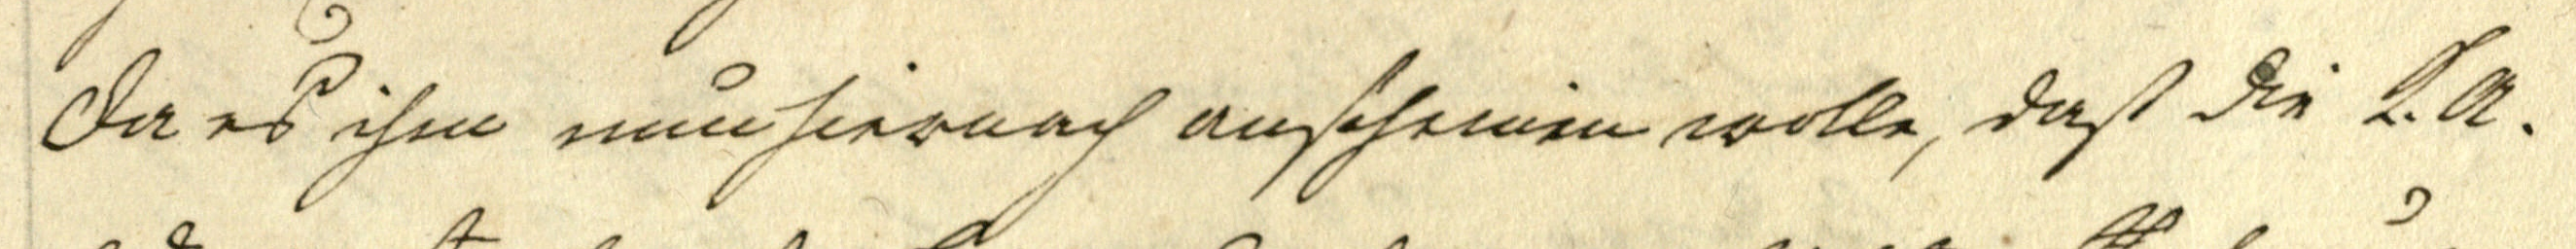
Da es ihm nun hiernach anscheinen wolle, daß die K. A.
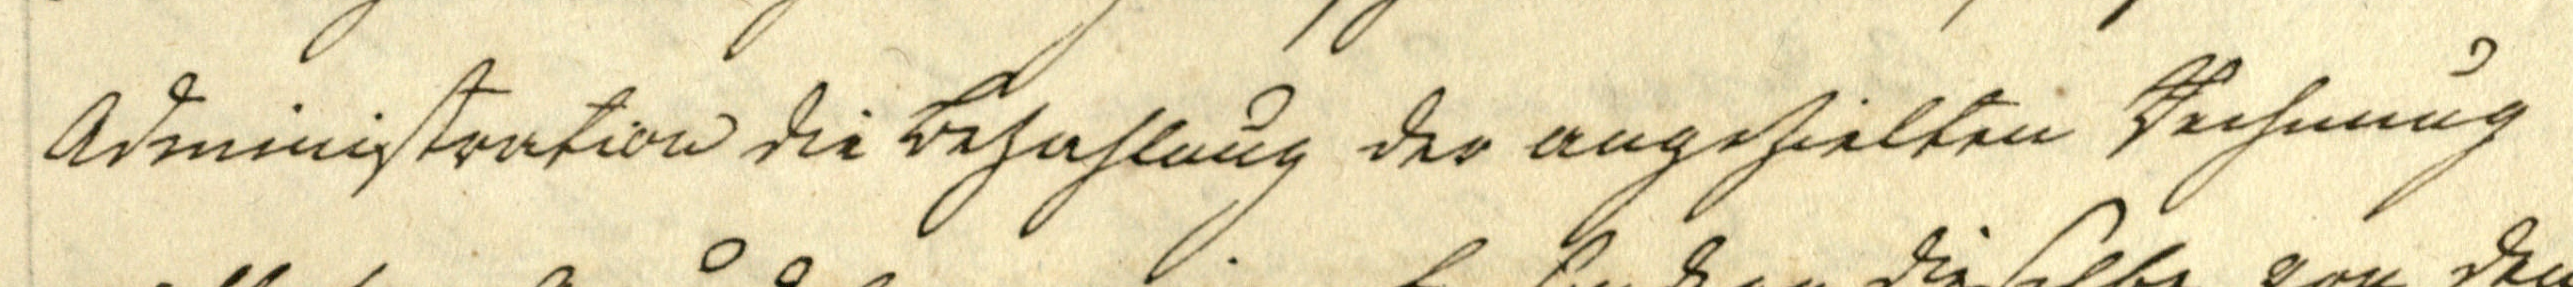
Administration die Bezahlung der angezielten Rechnung
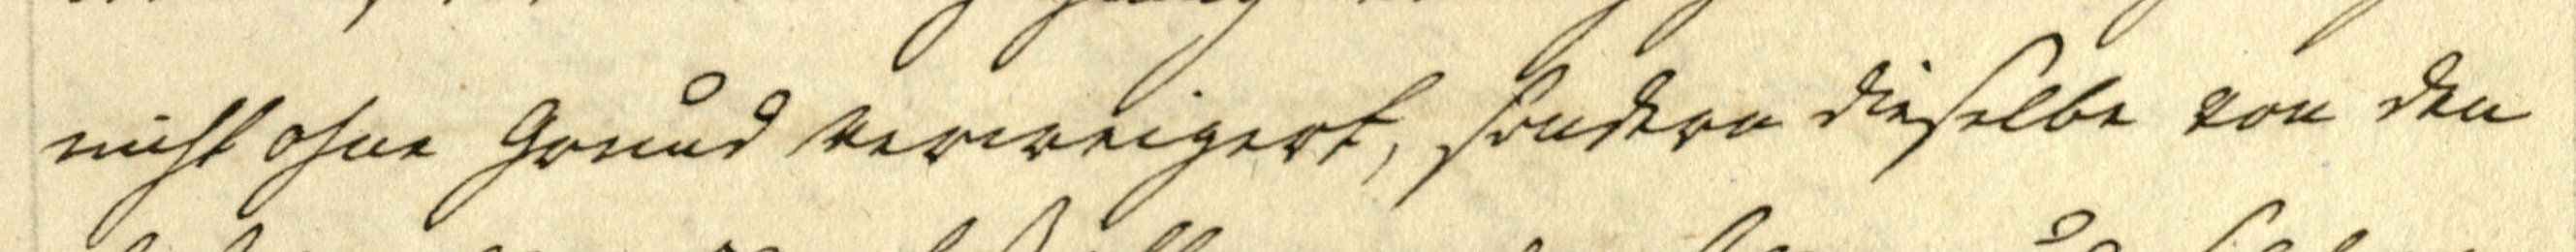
nicht ohne Grund verweigert, sondern dieselbe von den
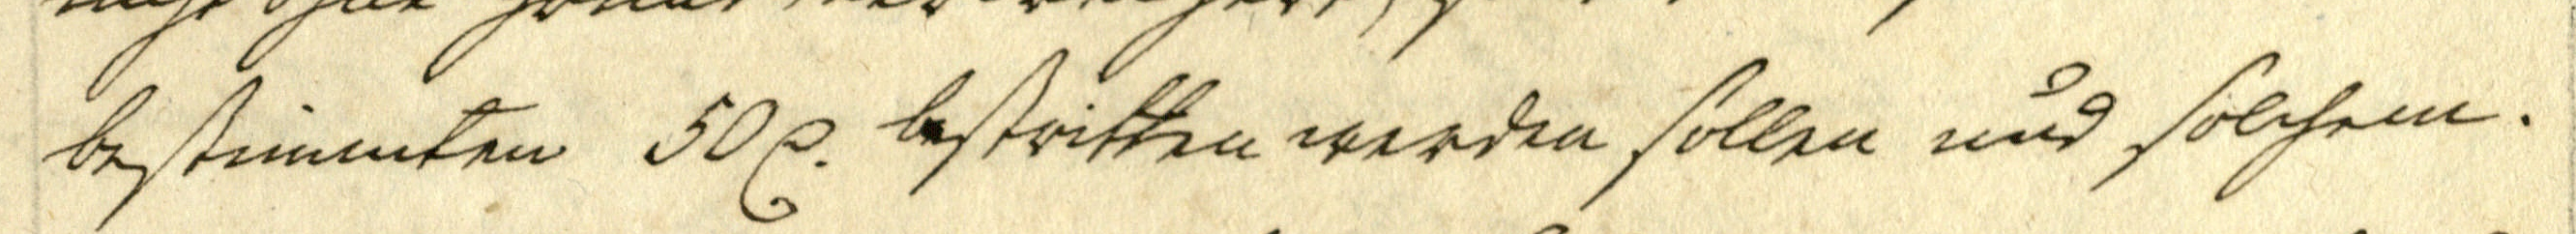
bestimmten 50 l. bestritten werden sollen und solchem
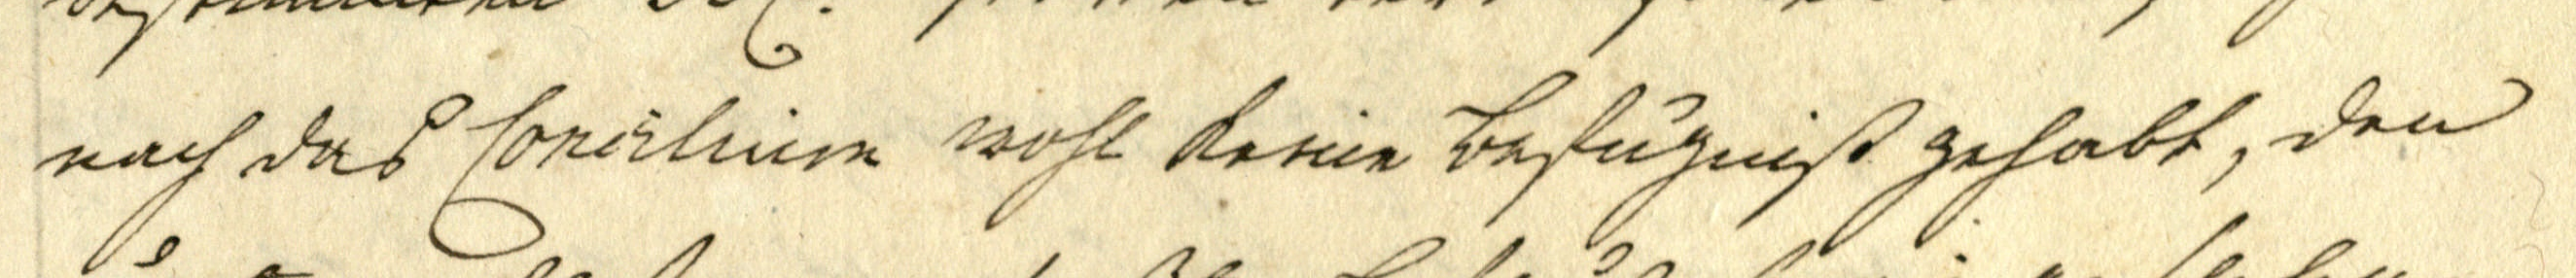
nach das Concilium wohl keine Befugniß gehabt, den
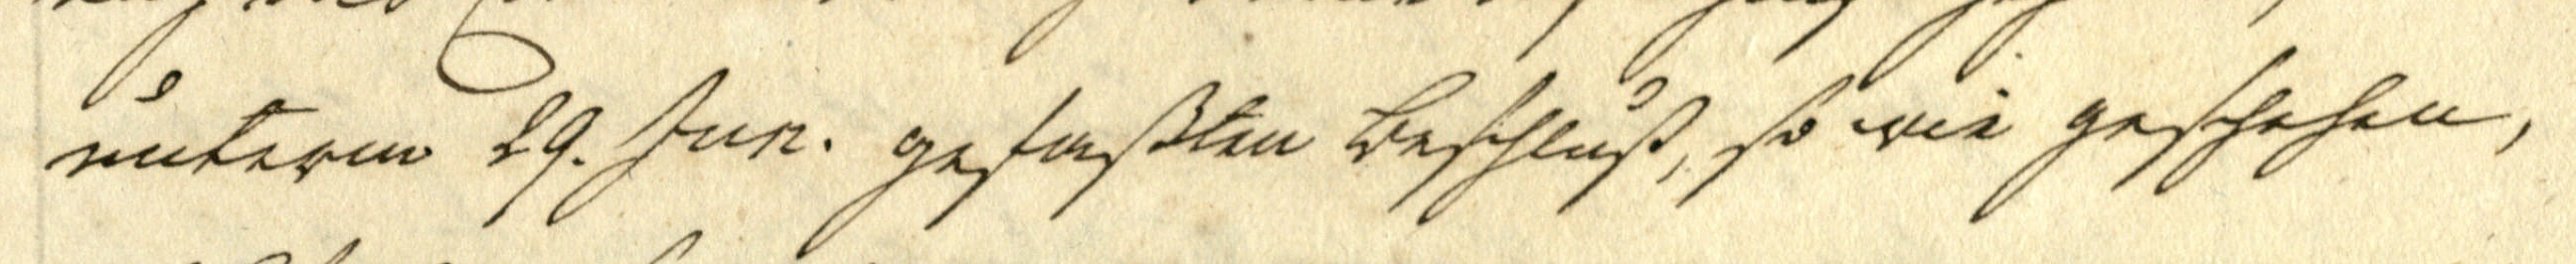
unterm 29. Jun. gefaßten Beschluß, so wie geschehen,
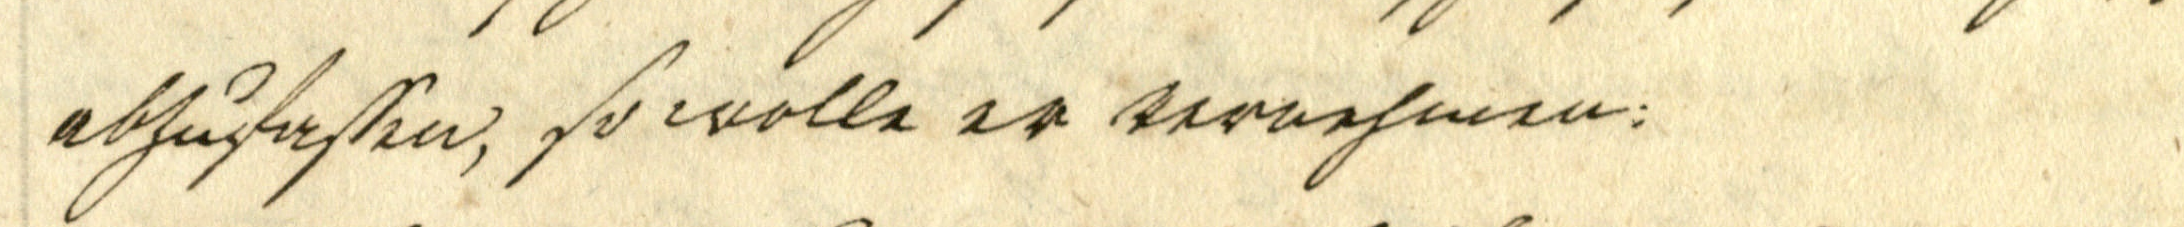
abzulassen, so wolle er vernehmen:
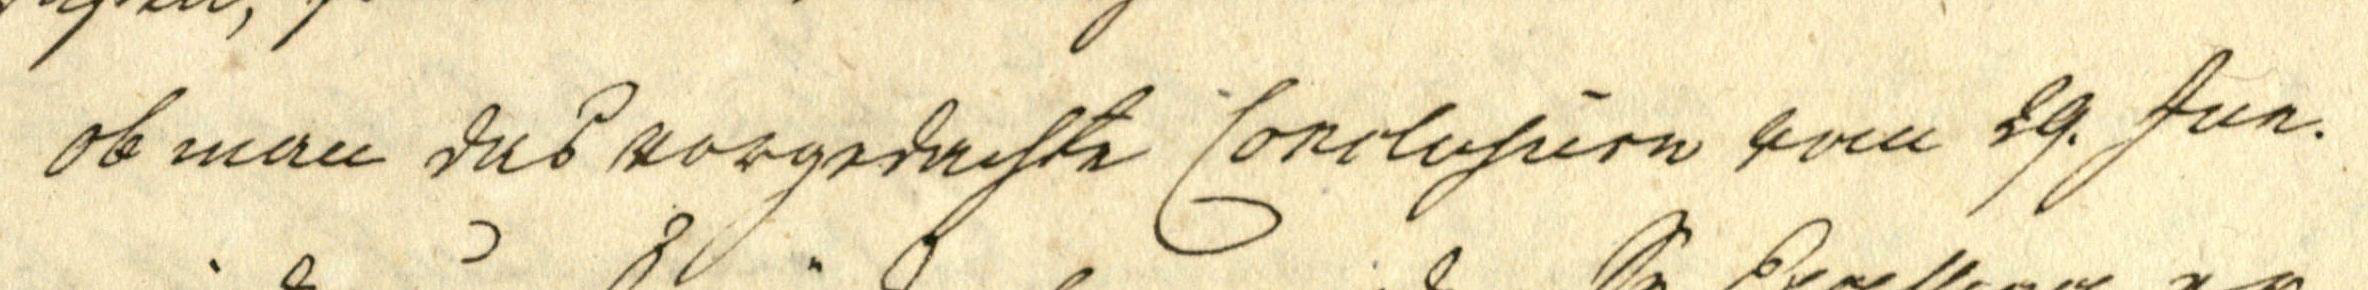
ob man das vorgedachte Conclusum vom 29. Jun.
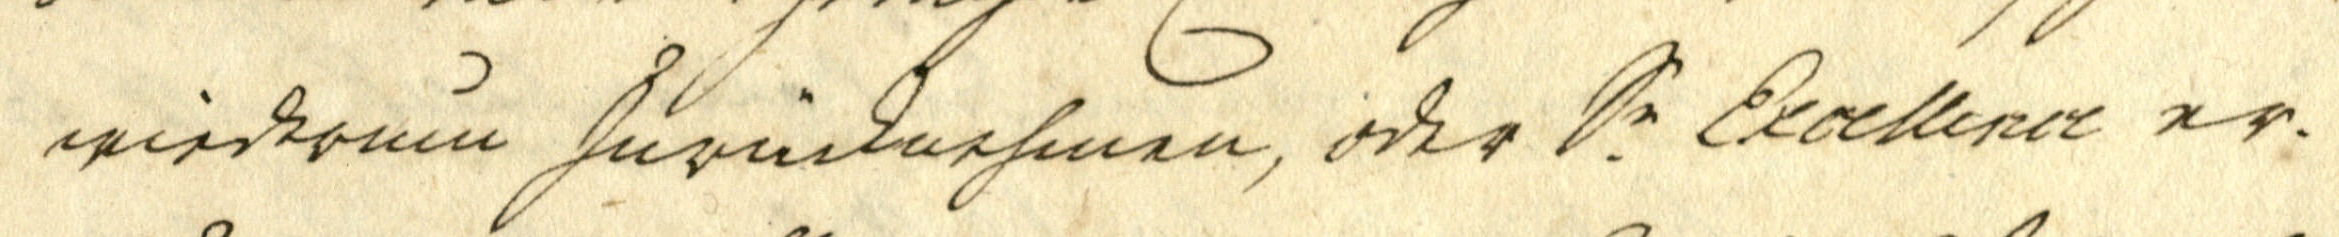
wiederum zurücknehmen, oder Sr. Excellence er¬
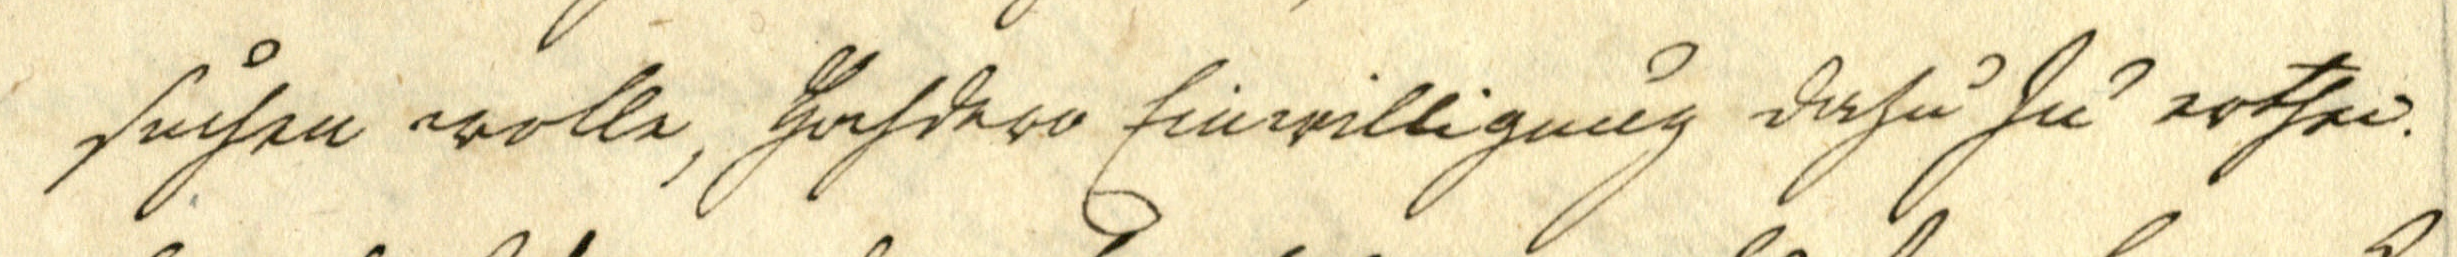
suchen wolle, Hochdero Einwilligung dahin zu erthei¬
